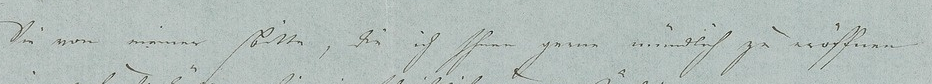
Sie von meiner Bitte, die ich Ihnen gerne mündlich zu eröffnen
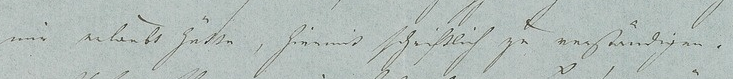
mir erlaubt hätte, hiermit schriftlich zu verständigen.
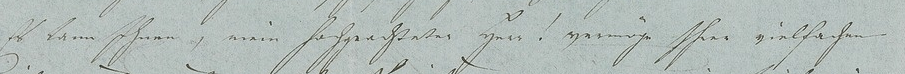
Es kann Ihnen, mein hochgeachteter Herr! vermöge Ihrer vielfachen
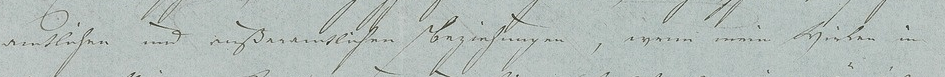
amtlichen und außeramtlichen Beziehungen, wenn mein Wirken in
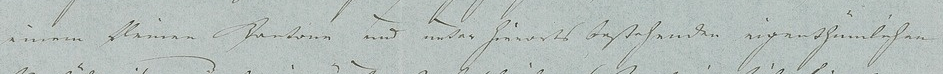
einem kleinen Kantone und unter hierorts bestehenden eigenthümlichen
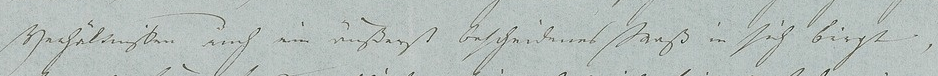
Verhältnissen auch ein äußerst bescheidenes Maß in sich birgt,
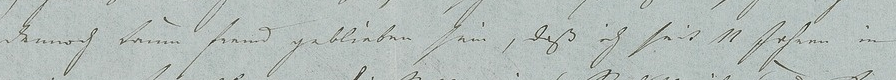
dennoch kaum fremd geblieben sein, daß ich seit 11 Jahren in
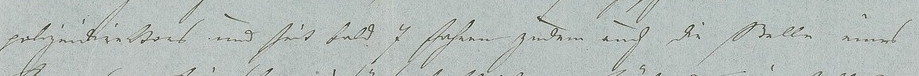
polizeidirektors und seit bald 7 Jahren zudem die Stelle eines
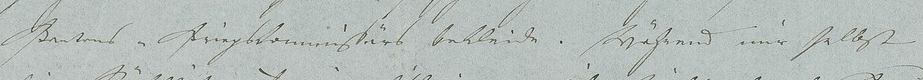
Kantons-Kriegskommissärs bekleide. Während mir selbst
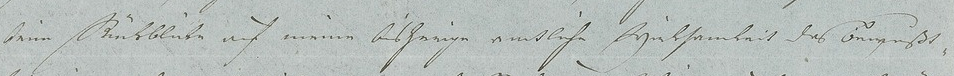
beim Rückblicke auf meine bisherige amtliche Wirksamkeit das Bewußt-
